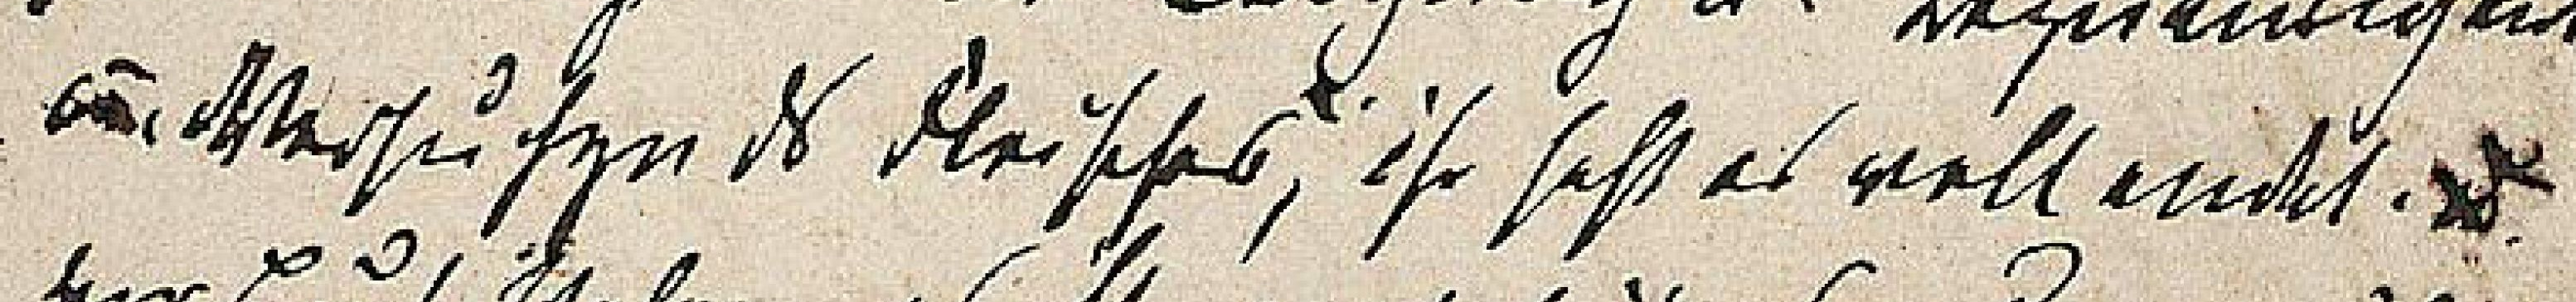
u. Versuchungen ds Fleisches, ihr seht es vollendet
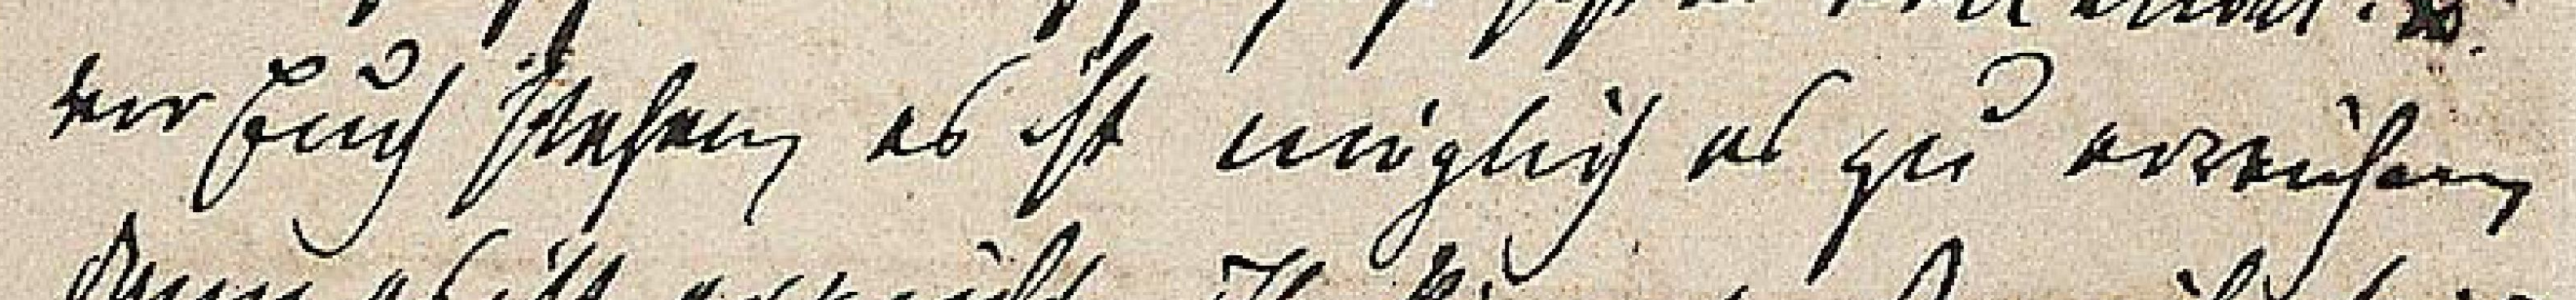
vor Euch stehen, es ist möglich es zu erreichen,
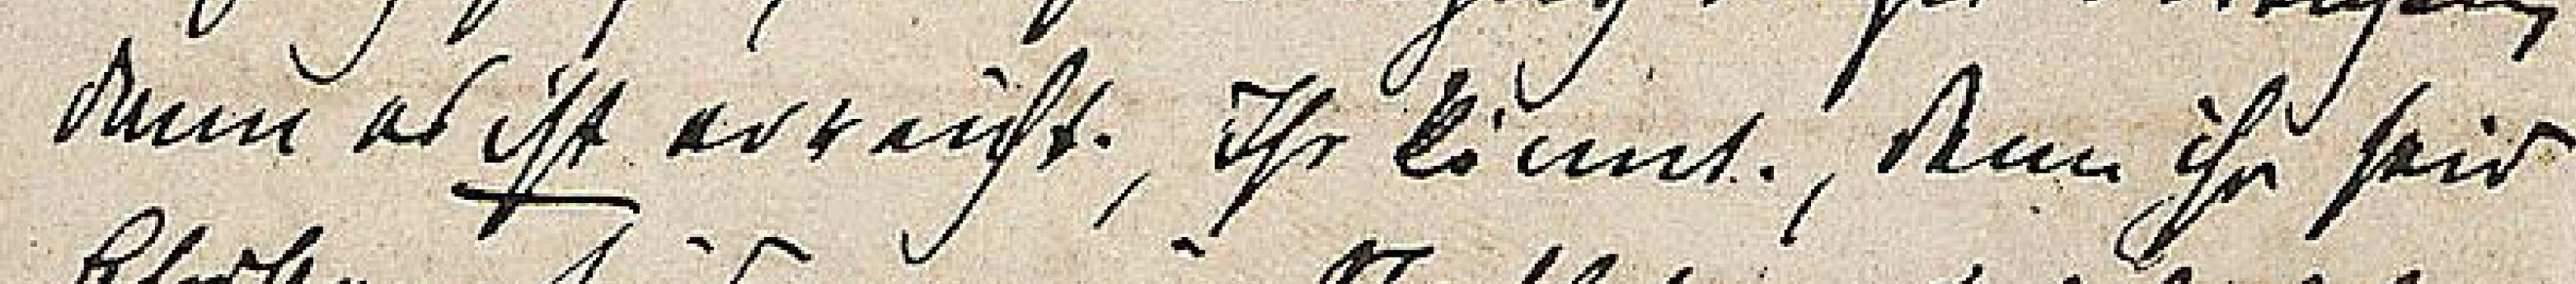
denn es ist erreicht, Ihr könnt., denn ihr seid
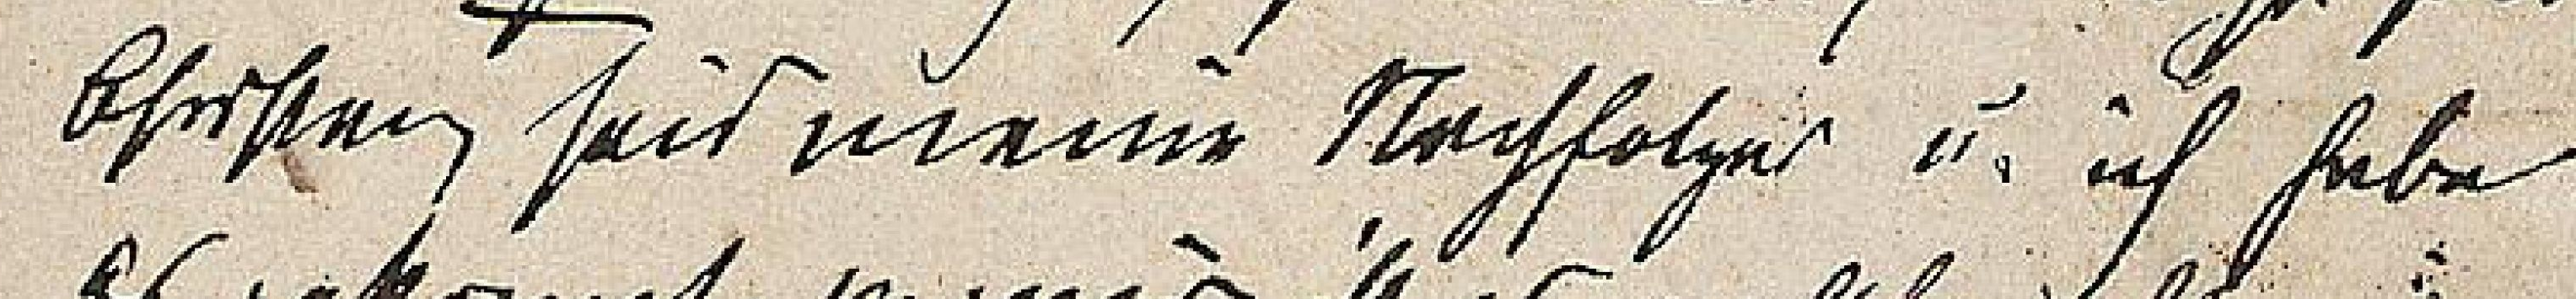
Christen, seid meine Nachfolger u. ich habe
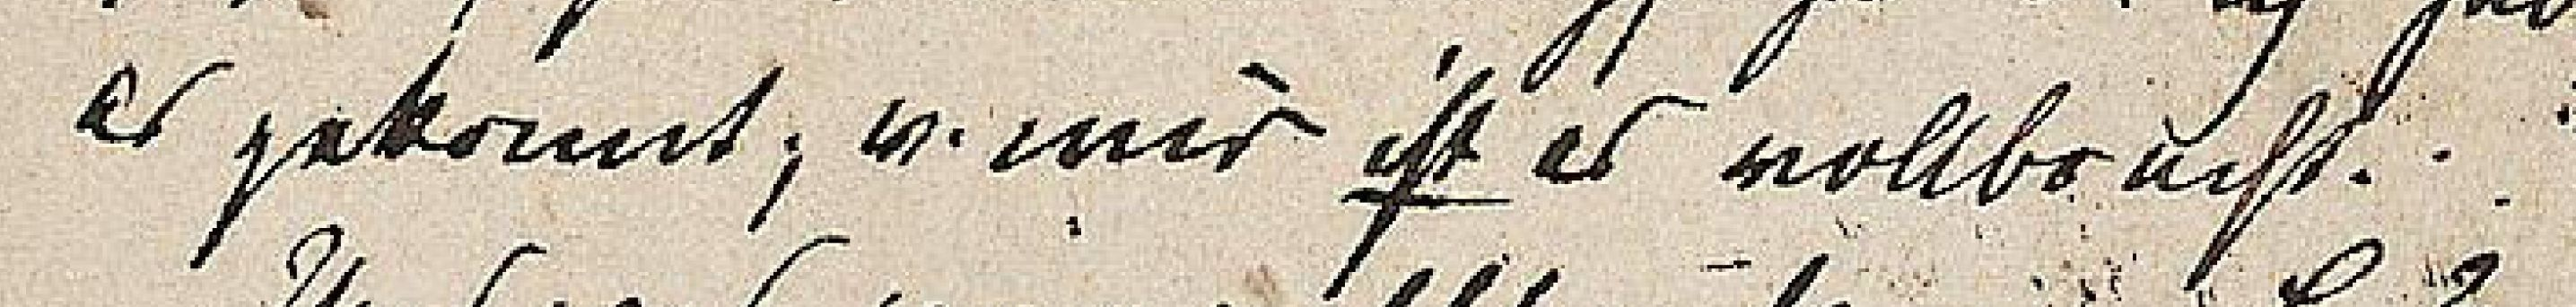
es gekonnt, v. mir ist es vollbracht
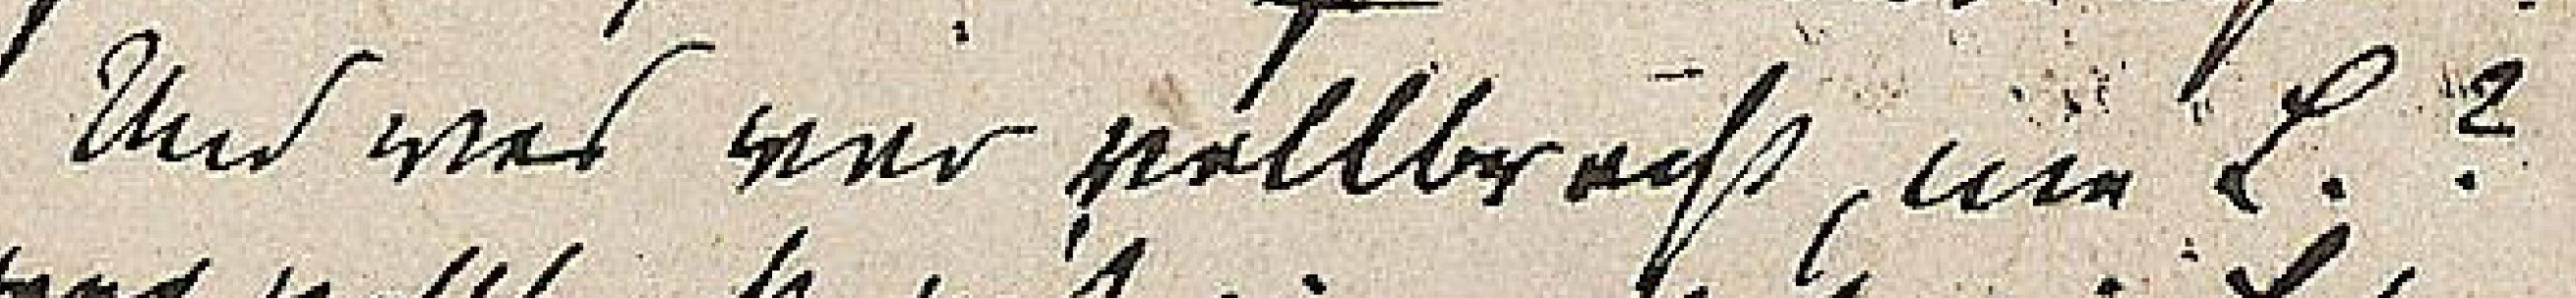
Und was war vollbracht, mn. L.?
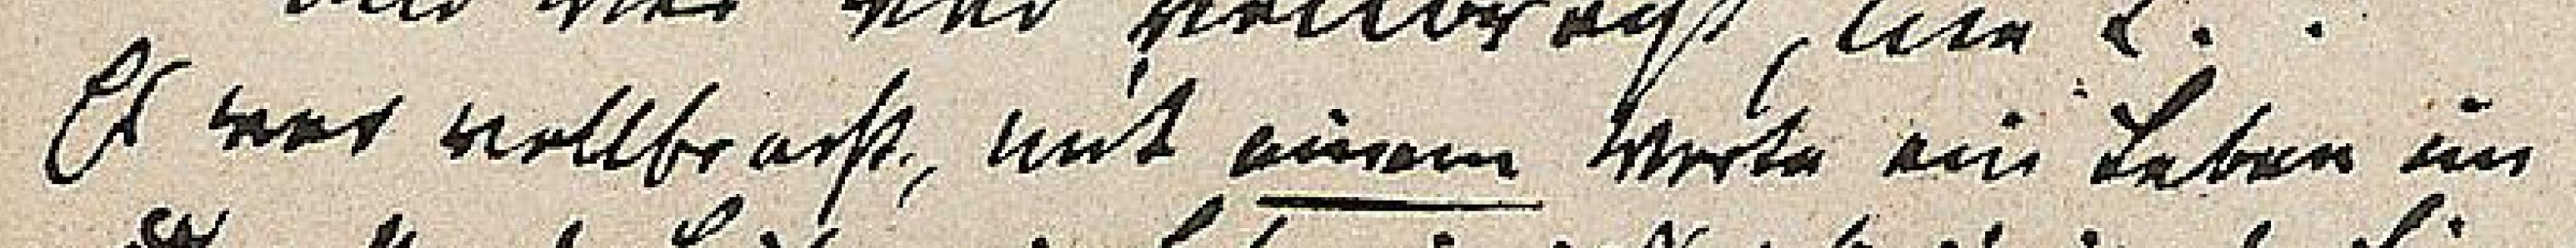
Es war vollbracht, mit einem Worte ein Leben im
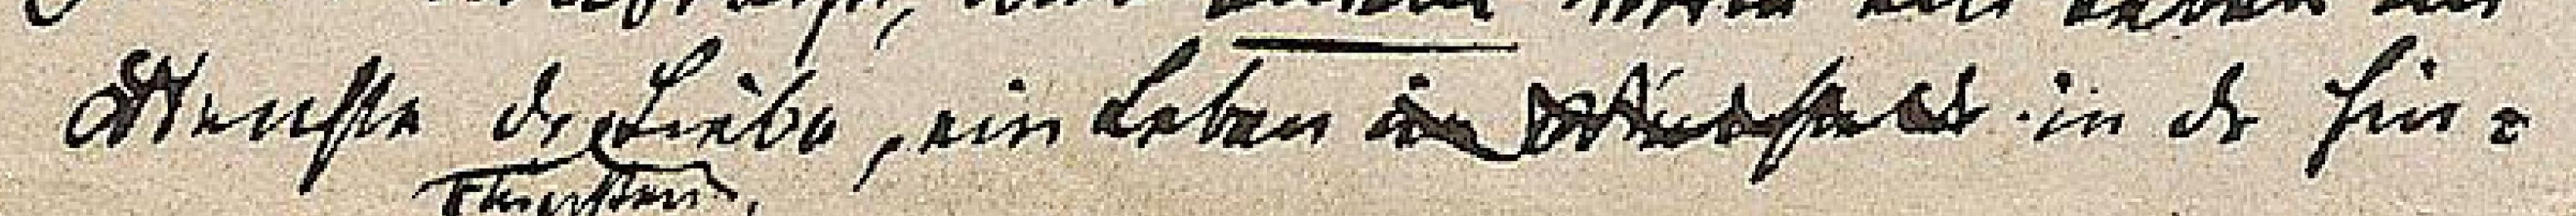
Dienste dr Liebe, ein Leben in Dienste dr in der hin¬
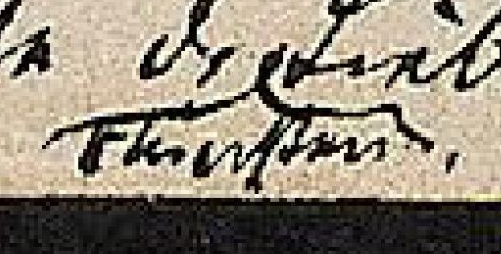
reinsten
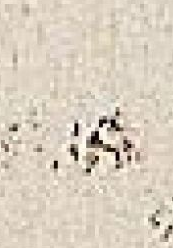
wie
